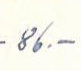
86
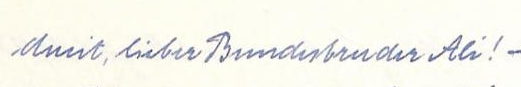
ducit, lieber Bundesbruder Ali!-
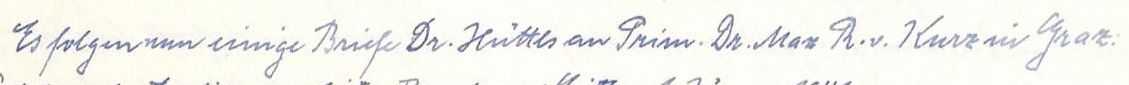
Es folgen nun einige Briefe Dr. Hüttls an Prim. Dr. Max R. v. Kurz in Graz
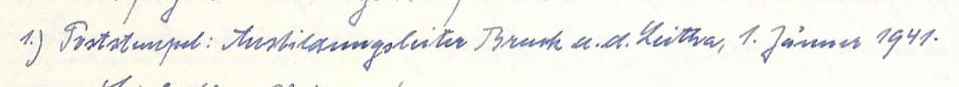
1) Poststempel: Ausbildungstilgungsleiter Bruck a. d. Leitha, 1. Jänner 1941.
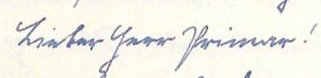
Lieber Herr Primar!
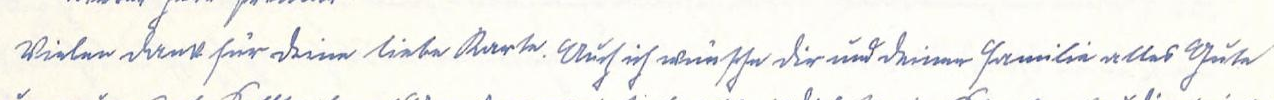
Vielen Dank für deine liebe Karte. Auch ich wünsche dir und deiner Familie alles Gute
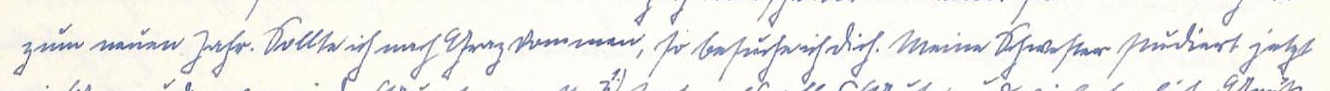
zum neuen Jahr. Sollte ich nach Graz kommen, so besuche ich dich. Meine Schwester studiert jetzt
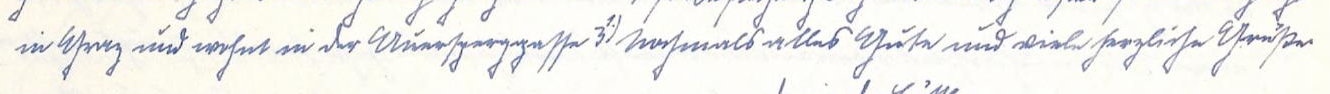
in Graz und wohnt in der Auersperggasse 3 1) Nochmals alles Gute und viele herzliche Grüße
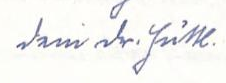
dein Dr. Hütt.
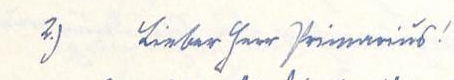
2) Lieber Herr Primarius!
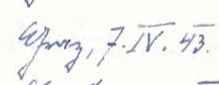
Graz, 7. IV. 43
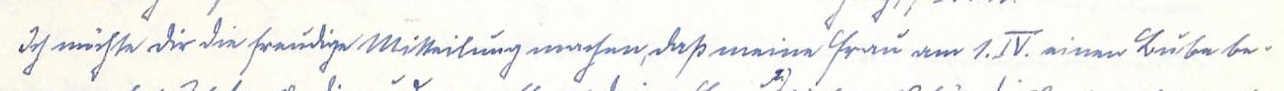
Ich möchte dir die feudige Mitteilung machen, daß meine Frau am 1.IV einen Bube be-
